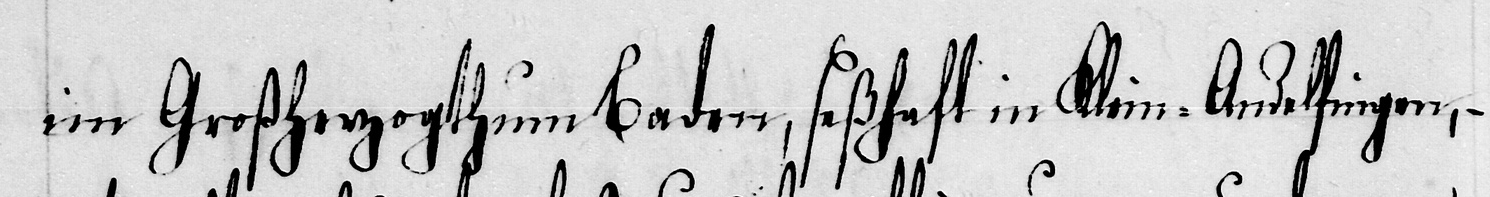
im Großherzogthum Baden, seßhaft in Klein-Andelfingen,
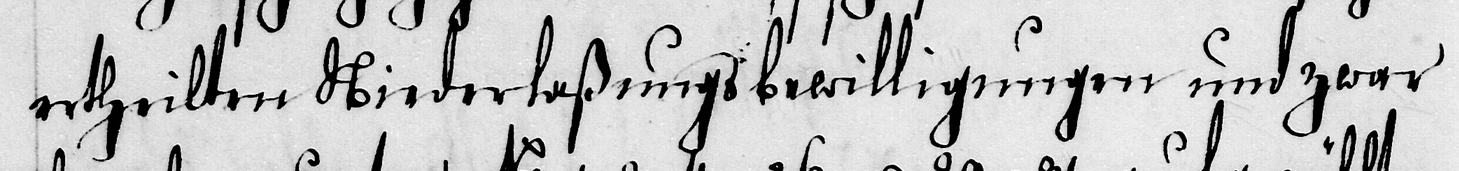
ertheilten Niederlaßungsbewilligungen und zwar
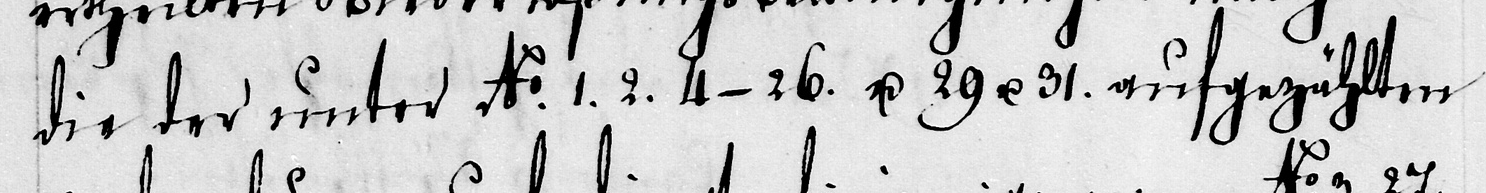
die der unter No. 1. 2. 4–26. u. 29 u. 31. aufgezählten
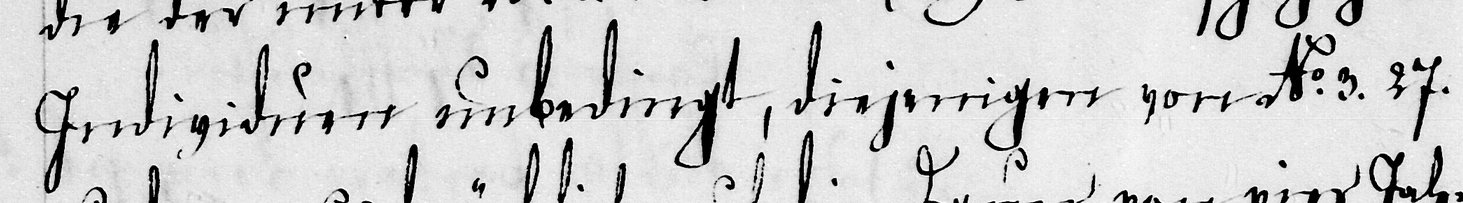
Individuen unbedingt, diejenigen von No.3. 27.
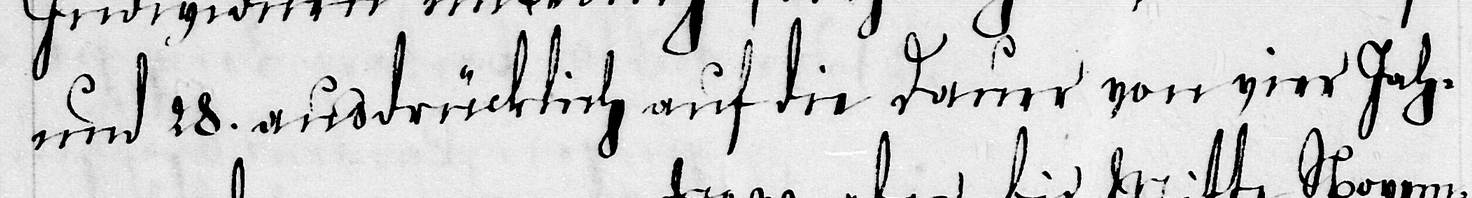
und 28. ausdrücklich auf die Dauer von vier Jah¬
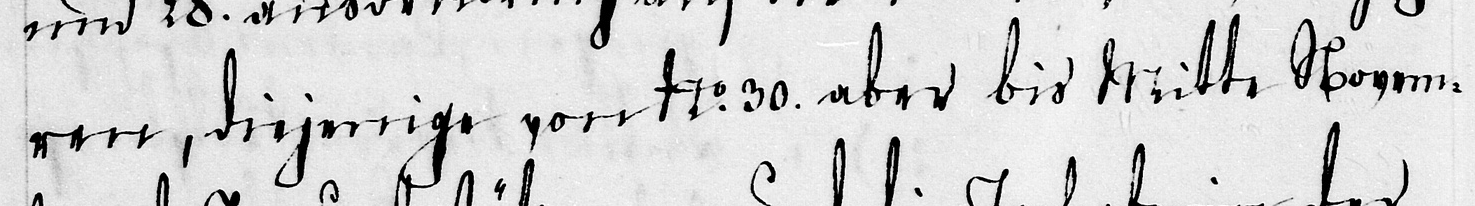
ren, diejenige von No. 30. aber bis Mitte Novem¬
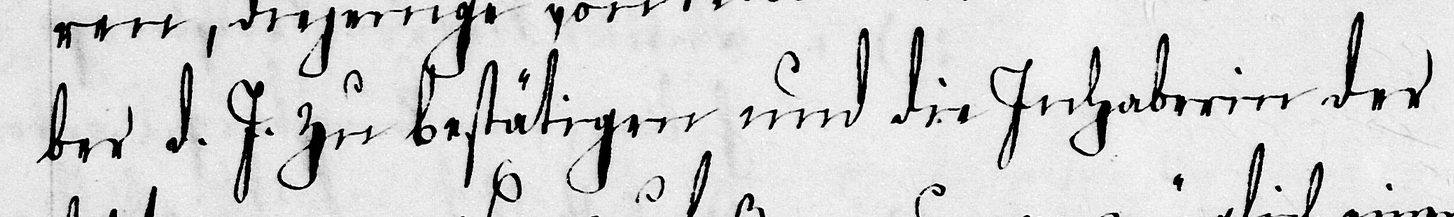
ber d. J. zu bestätigen und die Inhaberin der
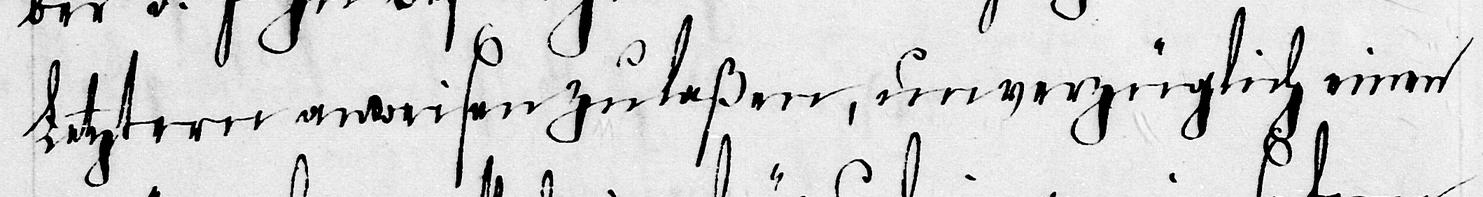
Letztern anweisen zu laßen, unverzüglich eine
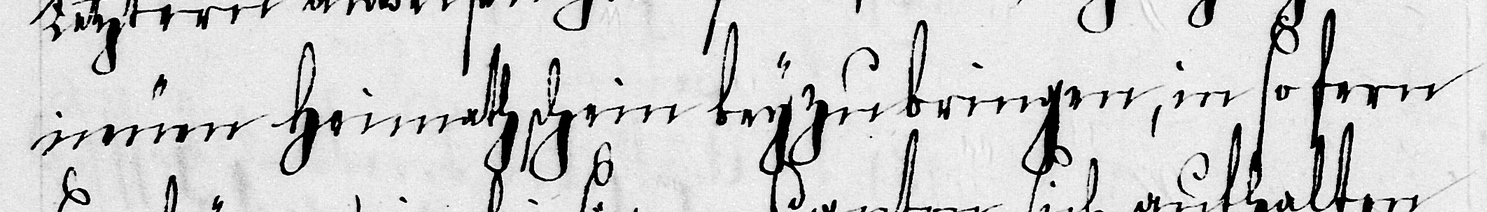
neuen Heimathschein beyzubringen, in so fern
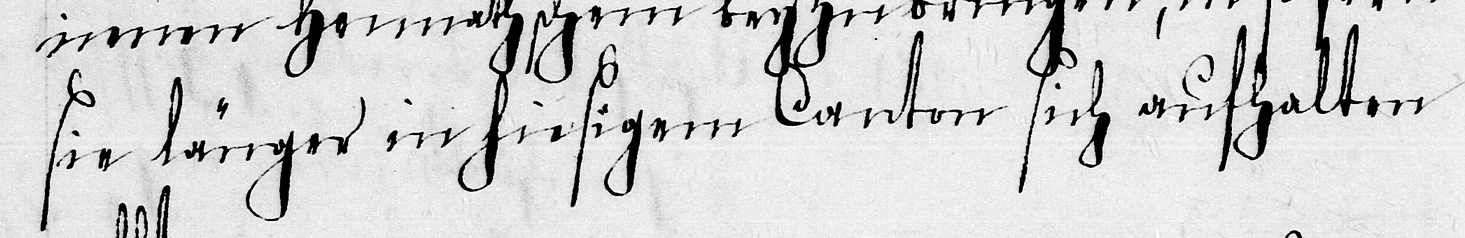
sie länger in hiesigem Canton sich aufhalten
